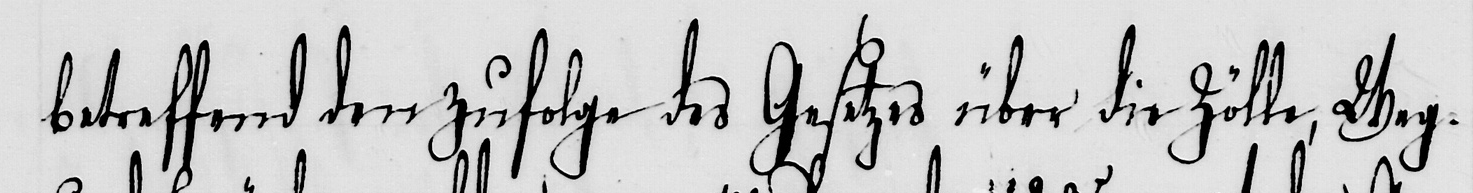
betreffend den zufolge des Gesetzes über die Zölle,
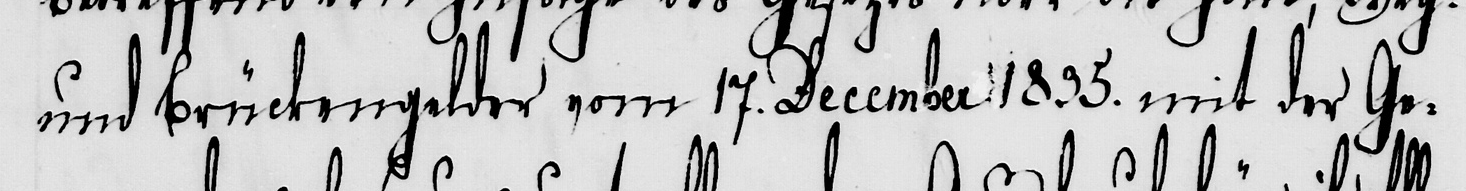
und Brückengelder vom 17. December 1835. mit der Ge¬
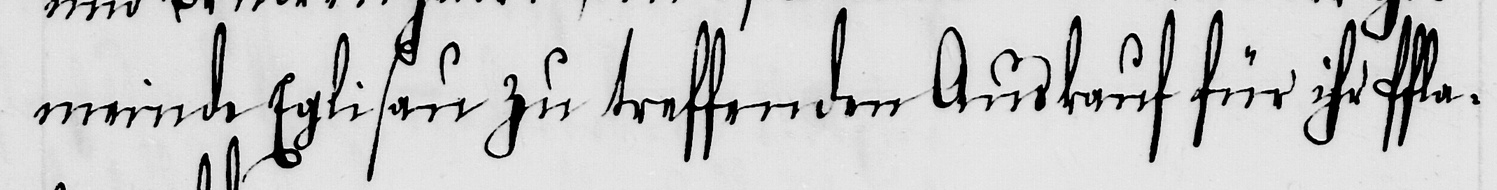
meinde Eglisau zu treffenden Auskauf für ihr Pf¬
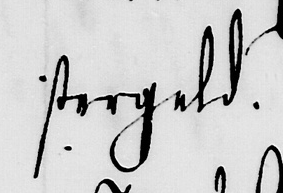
stergeld.
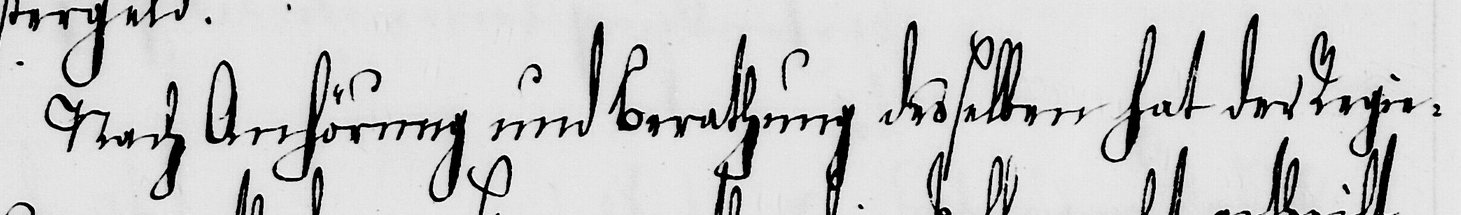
Nach Anhörung und Berathung desselben hat der Re¬
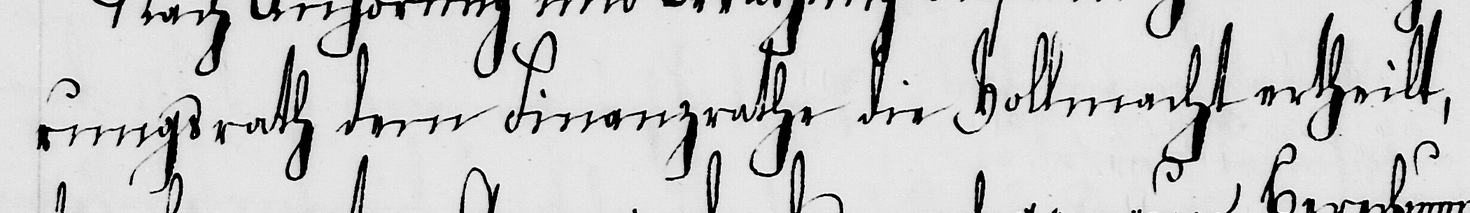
rungsrath dem Finanzrathe die Vollmacht ertheilt,
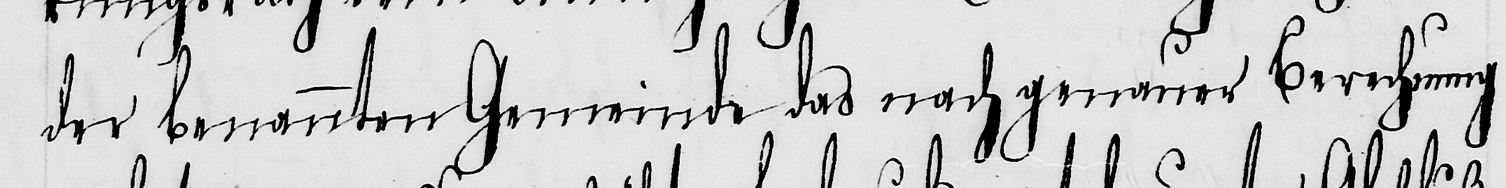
der benannten Gemeinde das nach genauer Berechnung
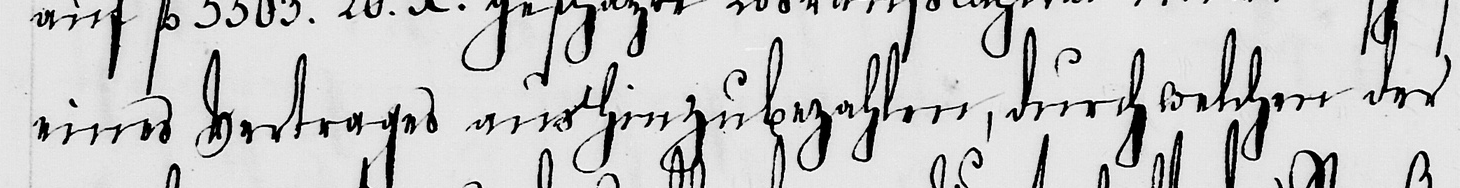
eines Vertrages aushinzubezahlen, durch welchen der
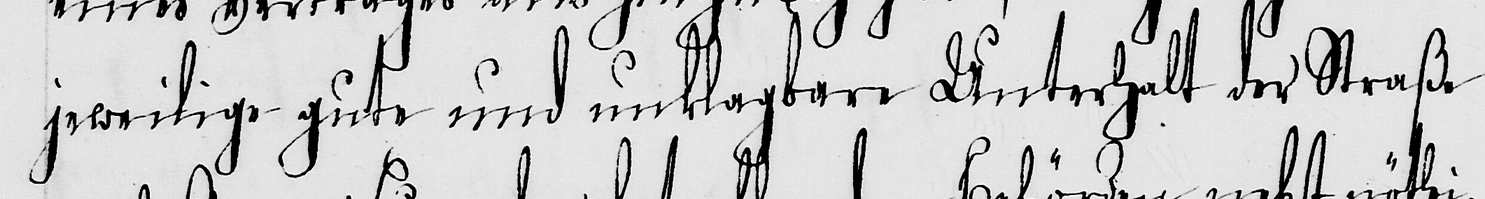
jeweilige gute und unklagbare Unterhalt der Straße
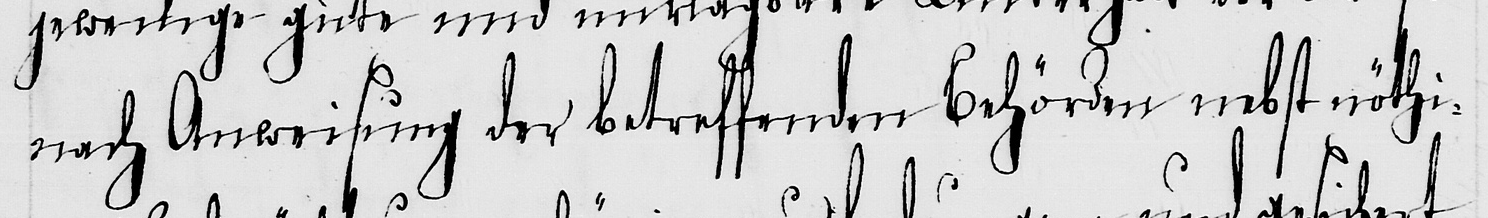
nach Anweisung der betreffenden Behörden nebst nöthi¬
